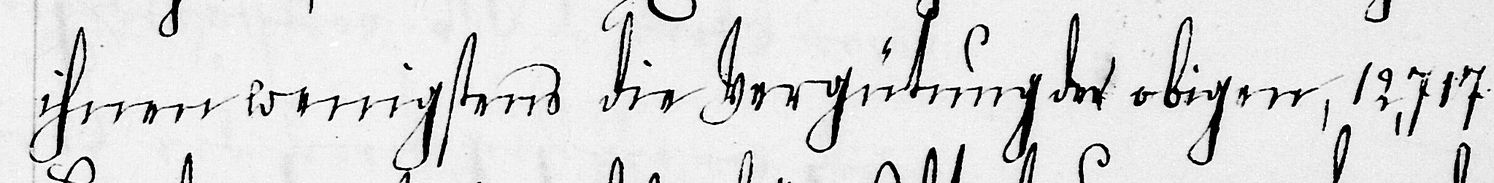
ihnen wenigstens die Vergütung der obigen, 12,717.
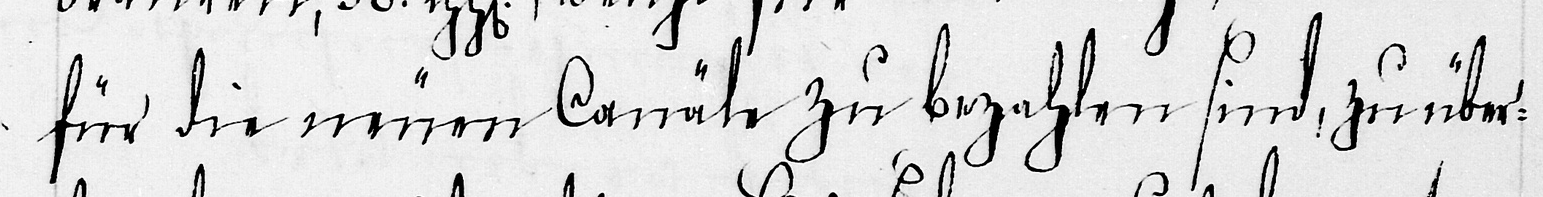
für die neuen Canäle zu bezahlen sind, zu über¬
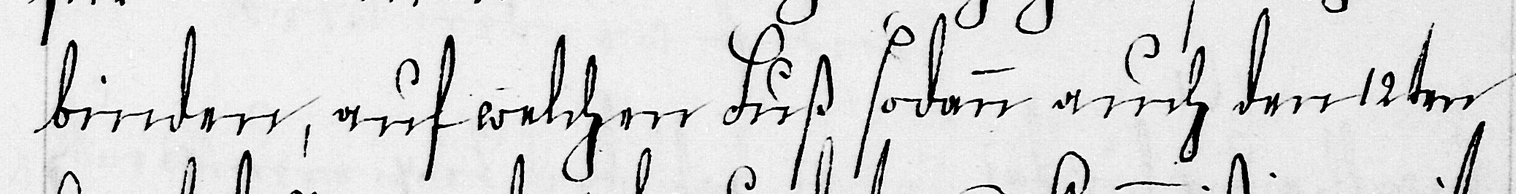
binden, auf welchen Fuß sodann auch den 12ten
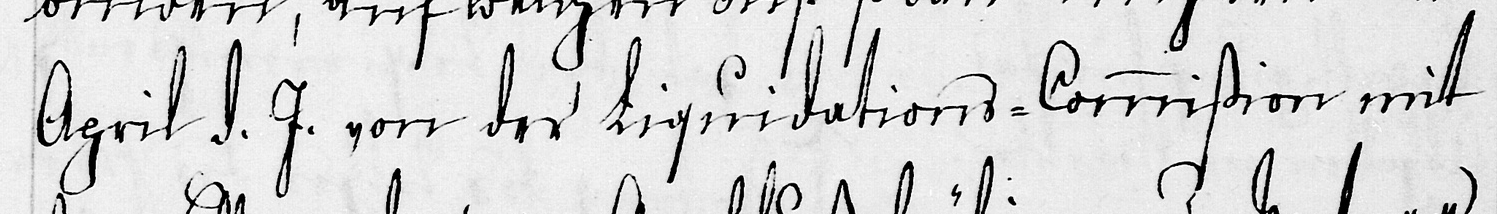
April d. J. von der Liquidations-Commißion mit
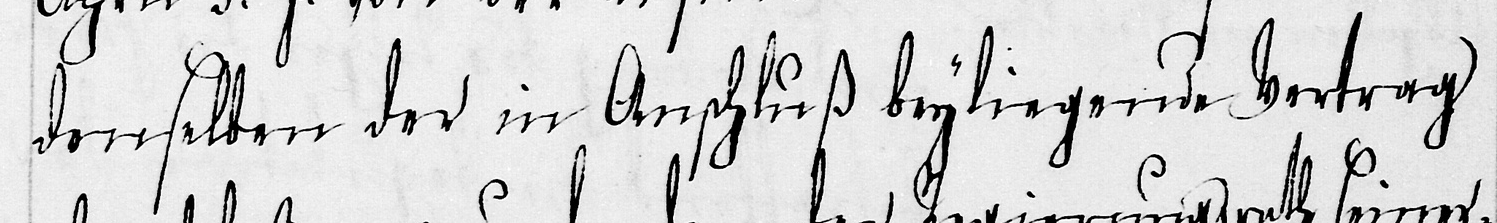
denselben der in Anschluß beyliegende Vertrag
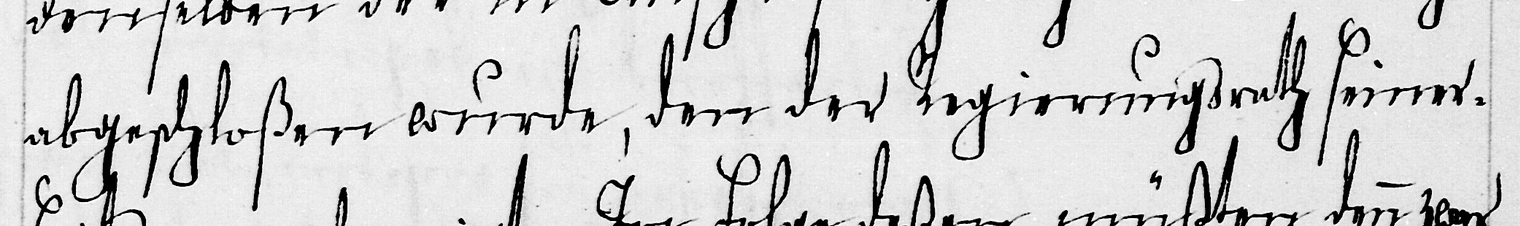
abgeschloßen wurde, den der Regierungsrath seiner¬
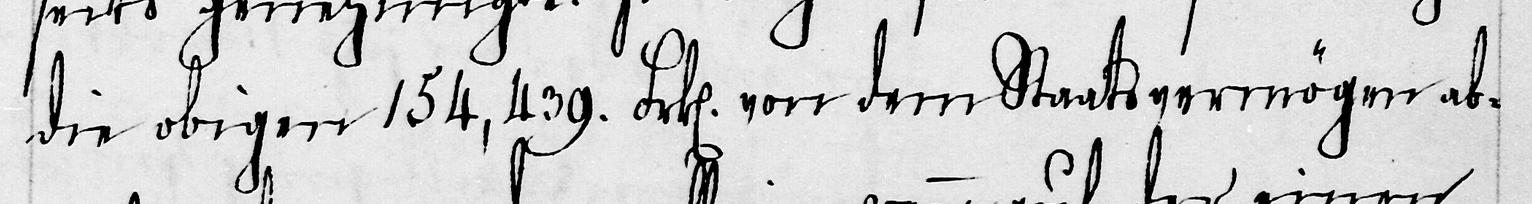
die obigen 154,439. Frk[en]. von dem Staatsvermögen ab¬
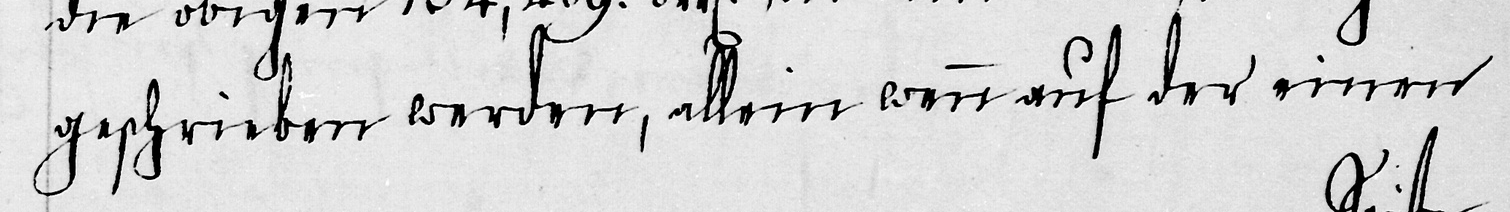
geschrieben werden, allein wenn auf der einen
